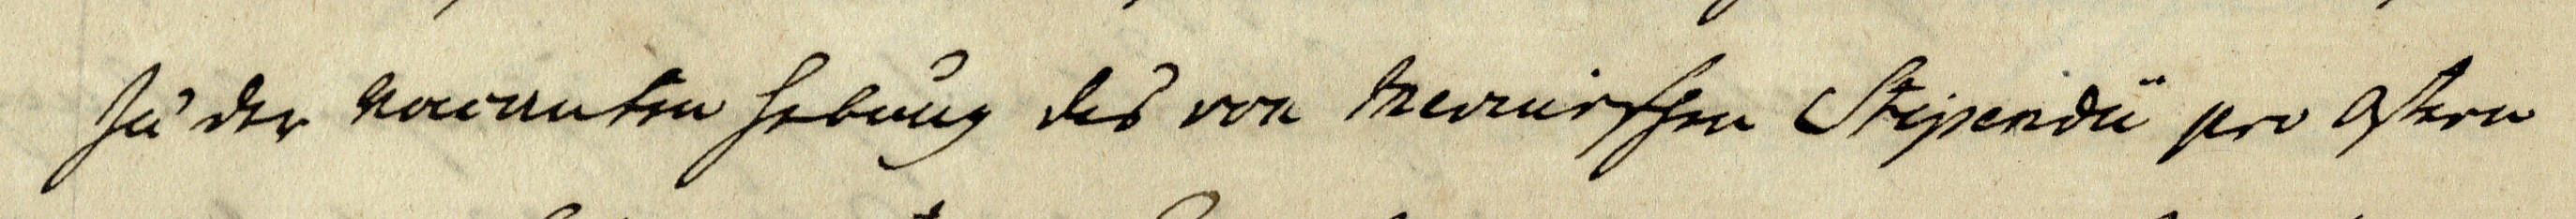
zu der vacanten Hebung des von Meviusschen Stipendii pro Ostern
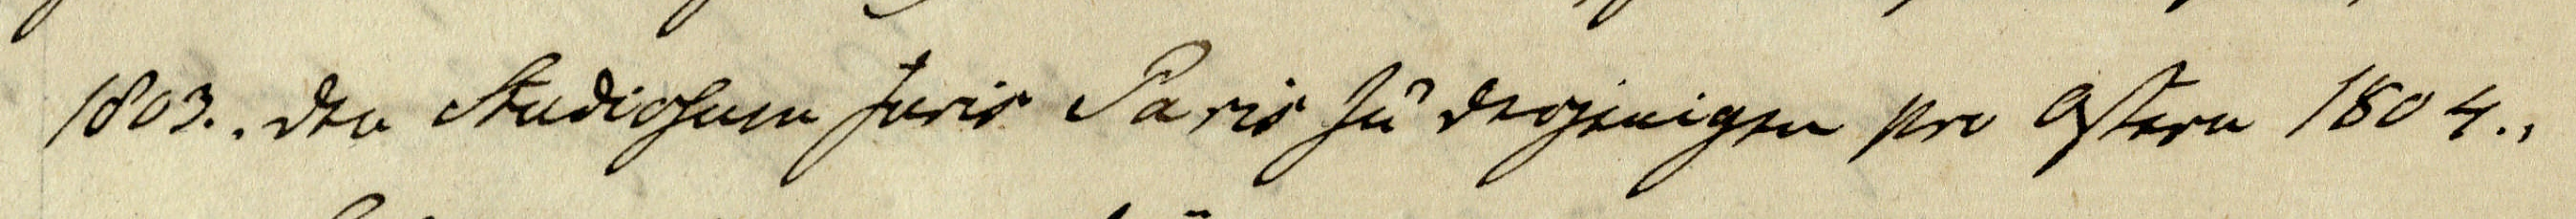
1803.. den Studiosum Juris Paris zu derjenigen pro Ostern 1804.,
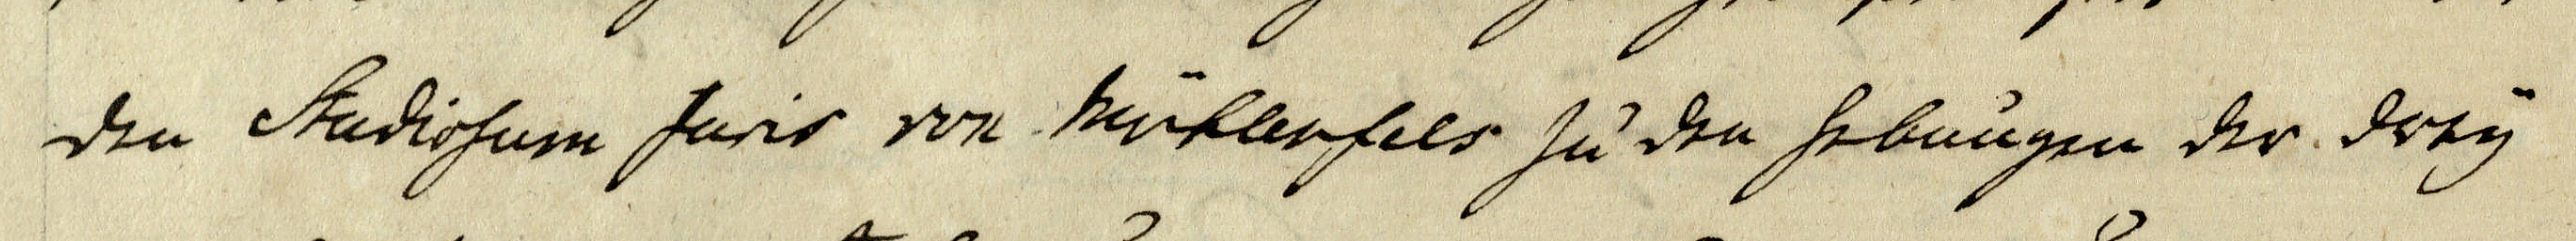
den Studiosum Juris von Mühlenfels zu den Hebungen der dreÿ
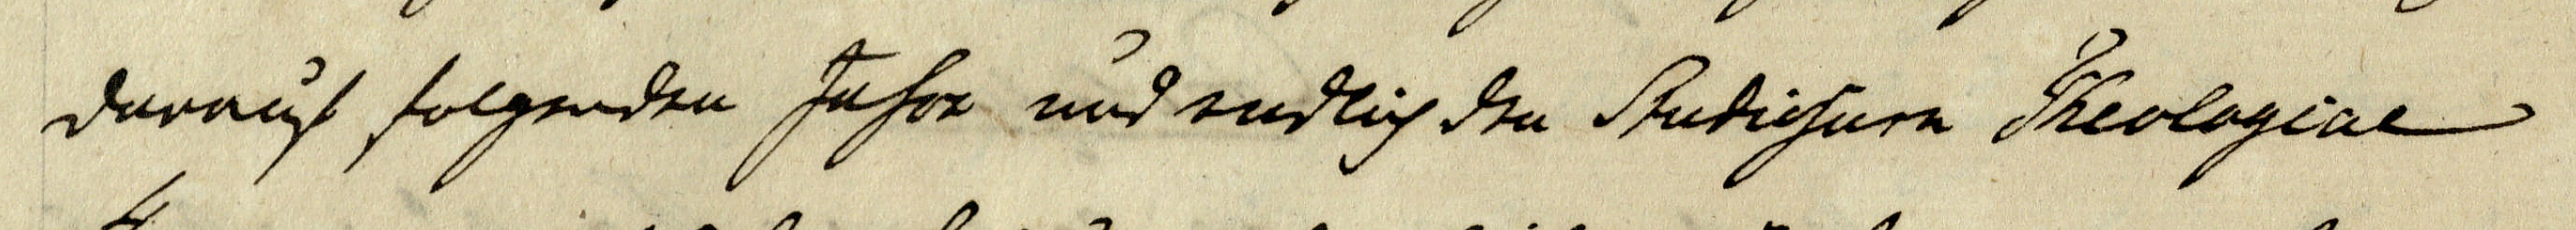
darauf folgenden Jahre und endlich den Studiosum Theologiae
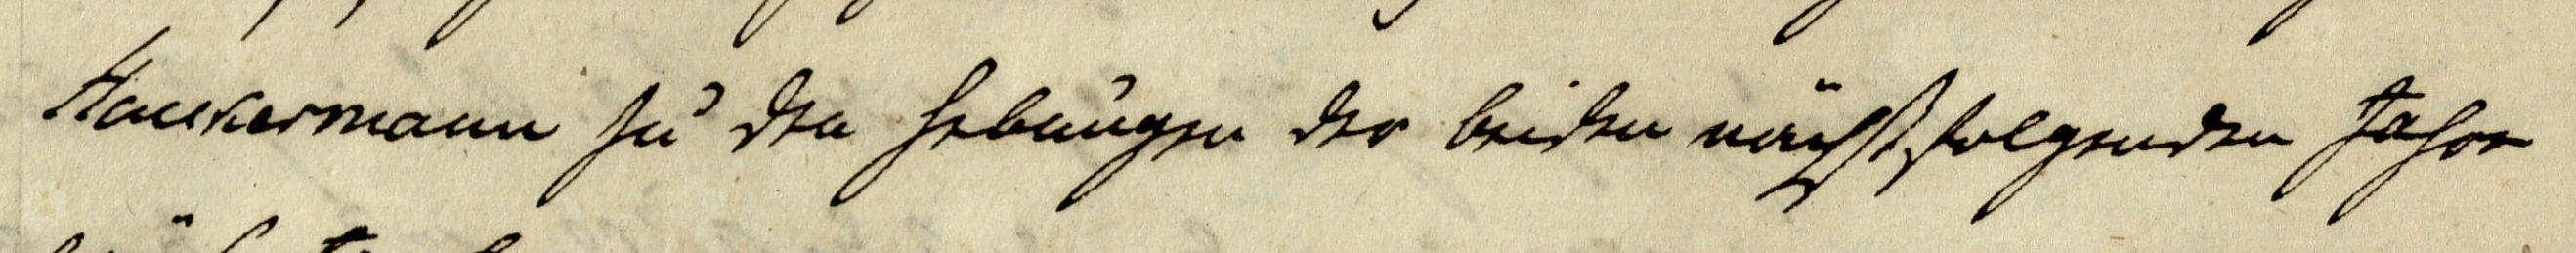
Haeckermann zu den Hebungen der beiden nächstfolgenden Jahre
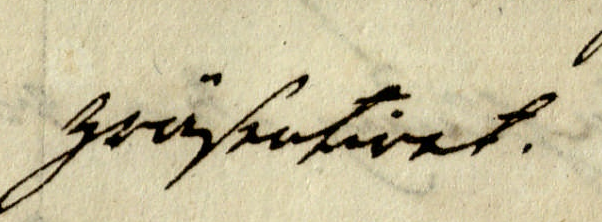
präsentiret.
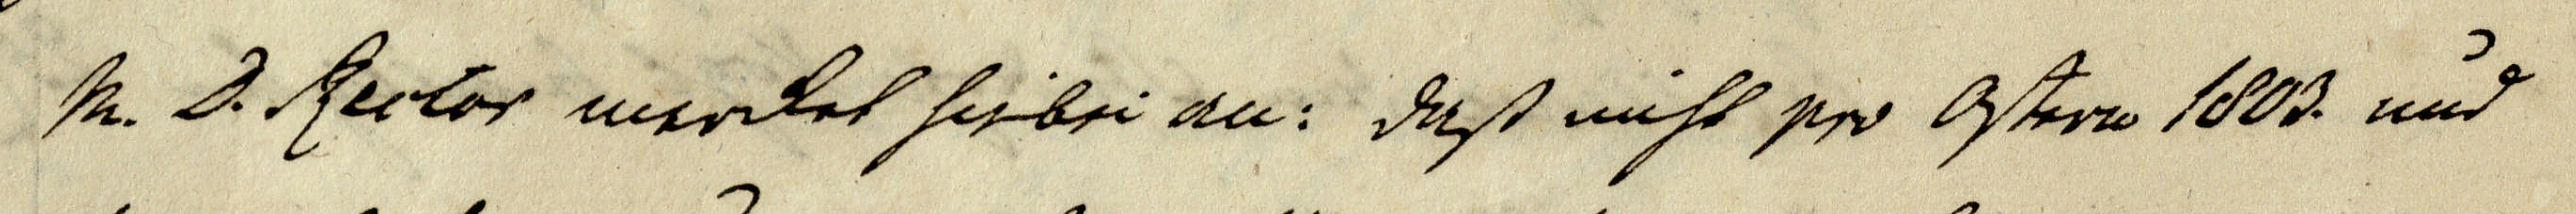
M. D. Rector merket hiebei an: daß nicht pro Ostern 1803 und
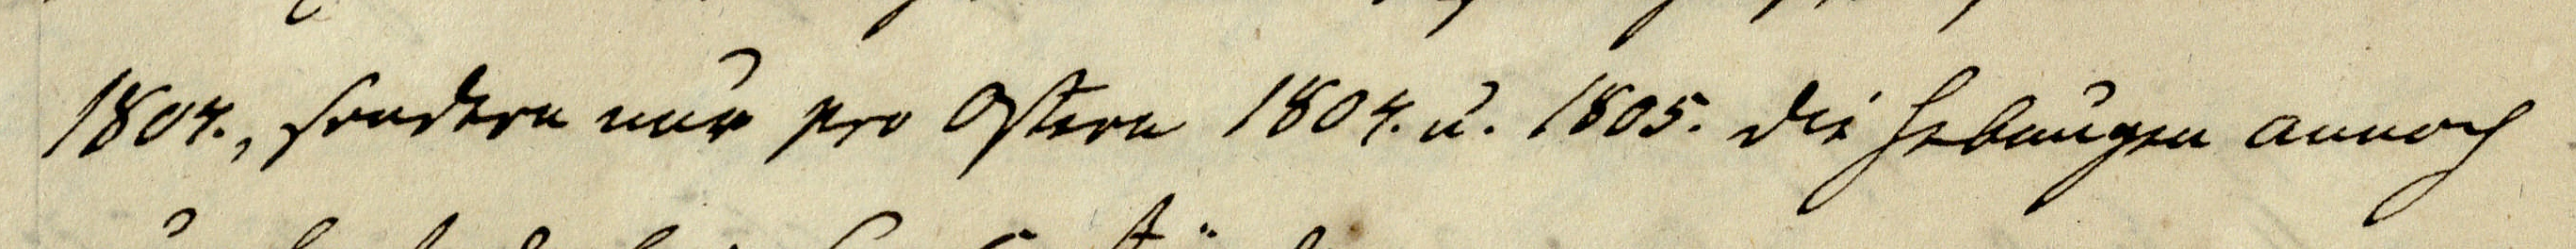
1804., sondern nur pro Ostern 1804. u. 1805. die Hebungen annoch
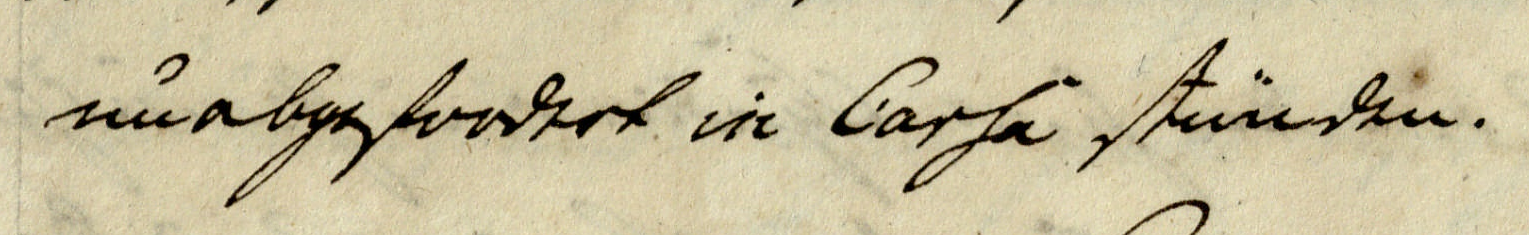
unabgefordert in Cassa stünden.
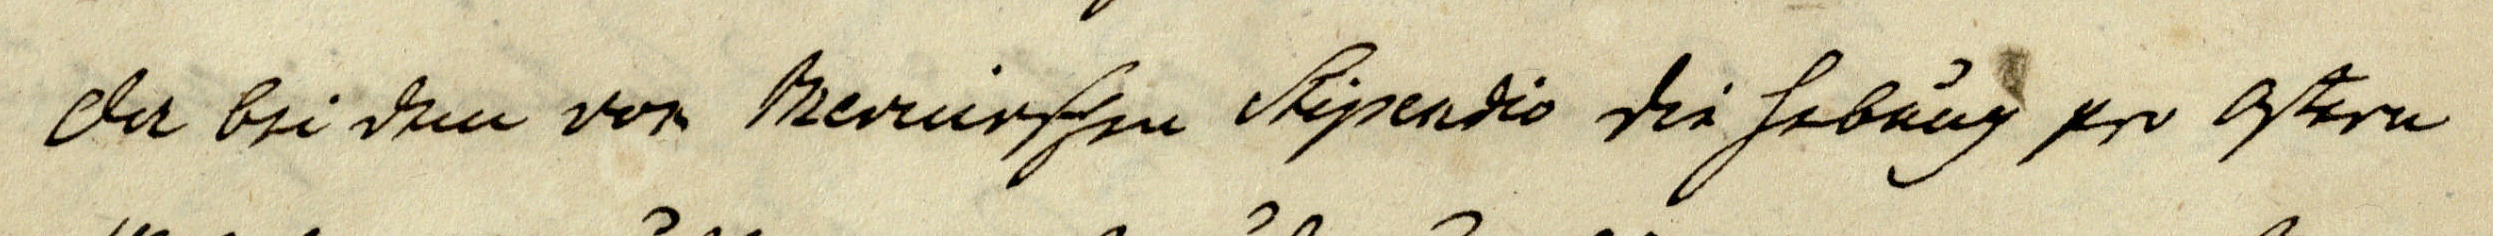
Da bei dem von Meviusschen Stipendio die Hebung pro Ostern
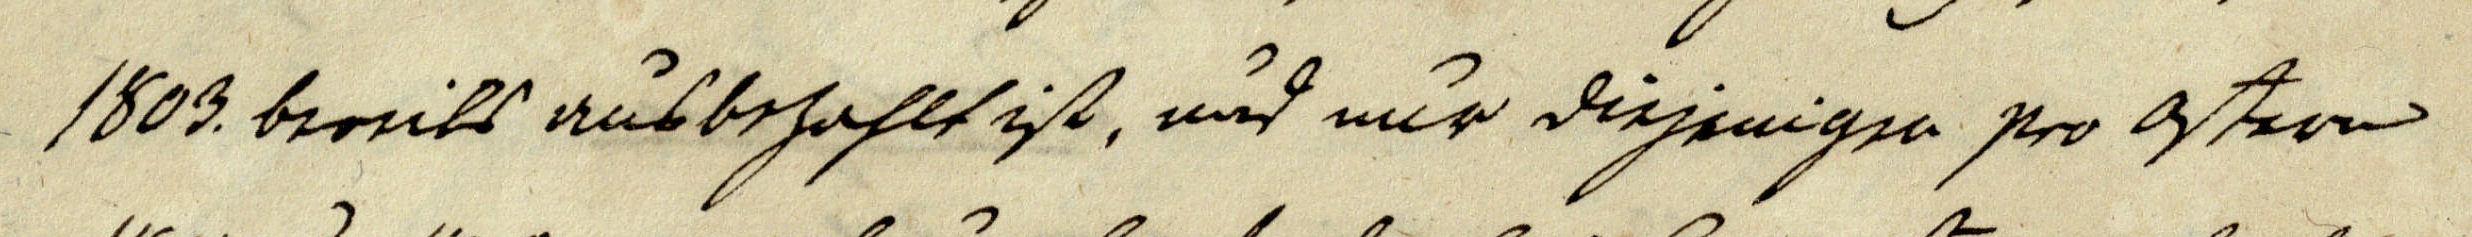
1803. bereits ausbezahlt ist, und nur diejenigen pro Ostern
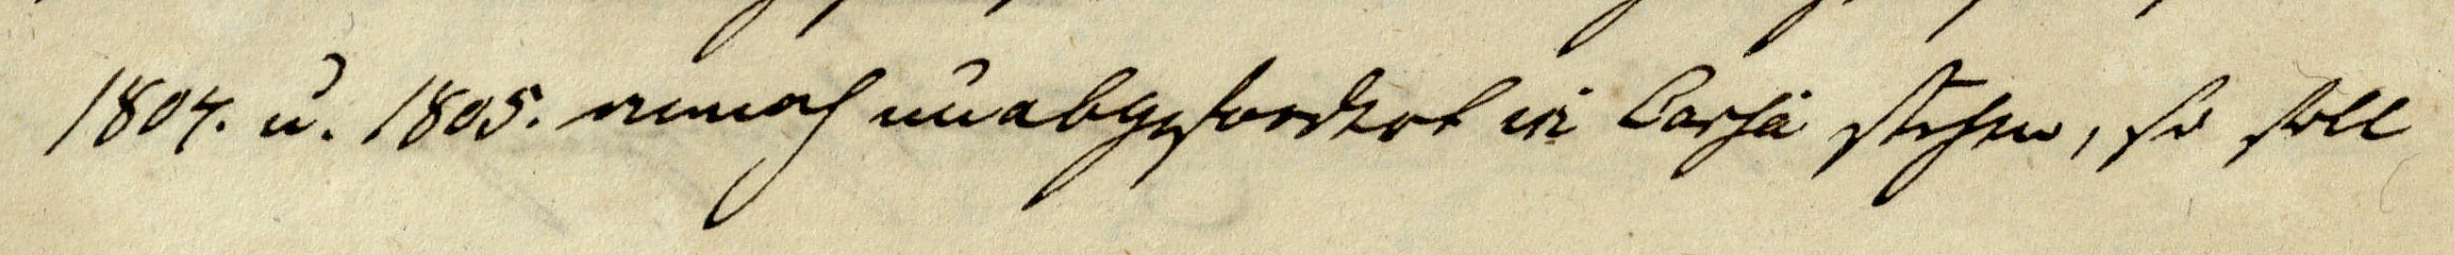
1804. u. 1805. annoch unabgefordert in Cassa stehen, so soll
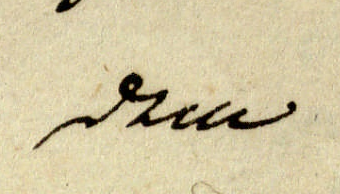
dem
